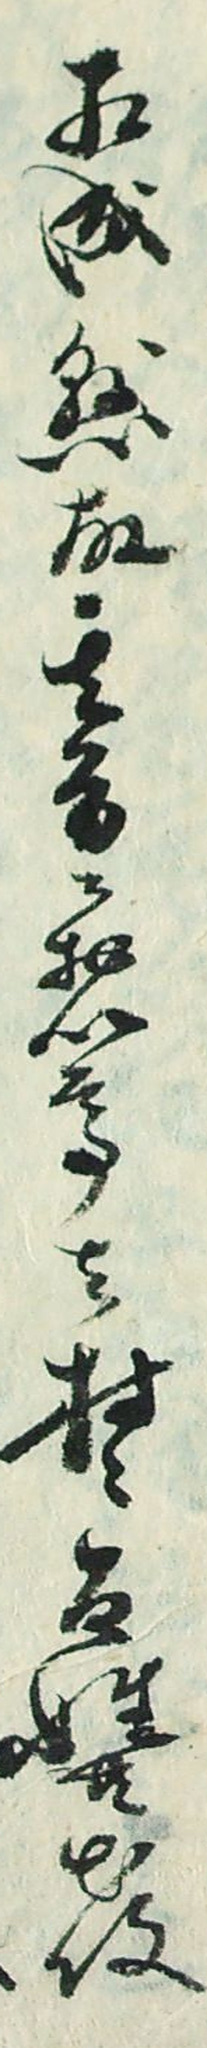相成然故其方ニおいては村々百姓共出役
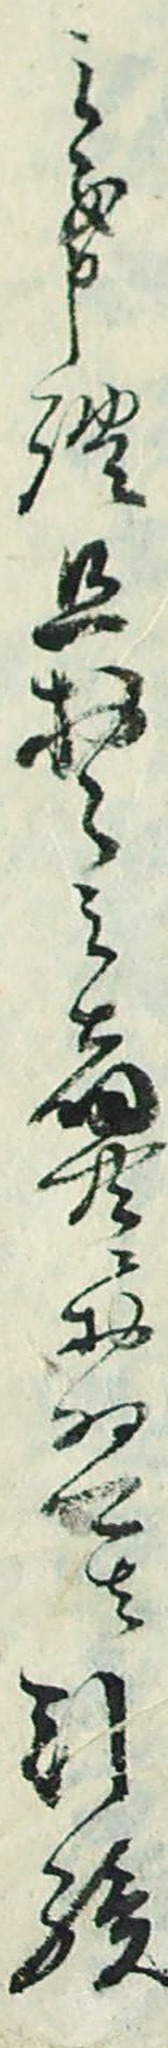之義申談且村々之者共ニおゐては引続

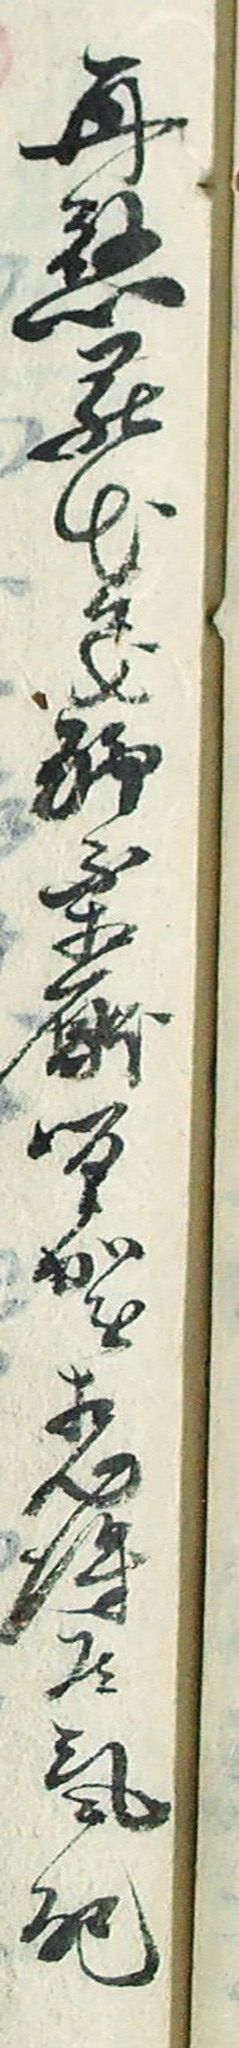再應罷出候義聊不相厭冥加を相心得候気配
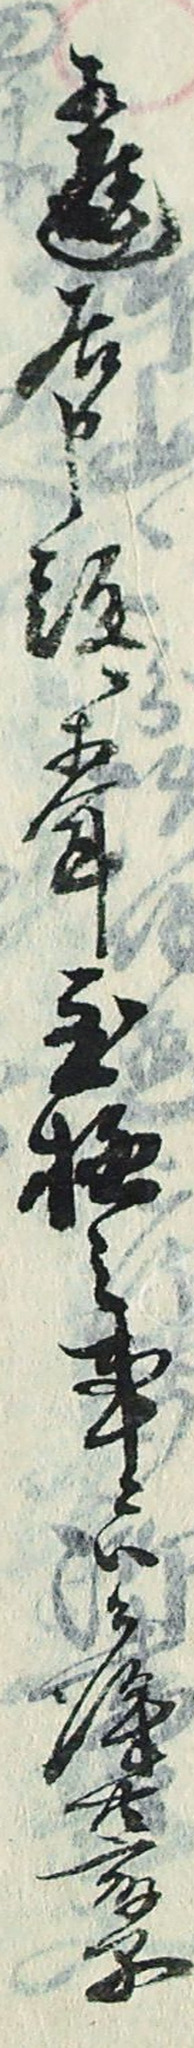相進居申趣ニ相聞至極之事ニハ候得共最早
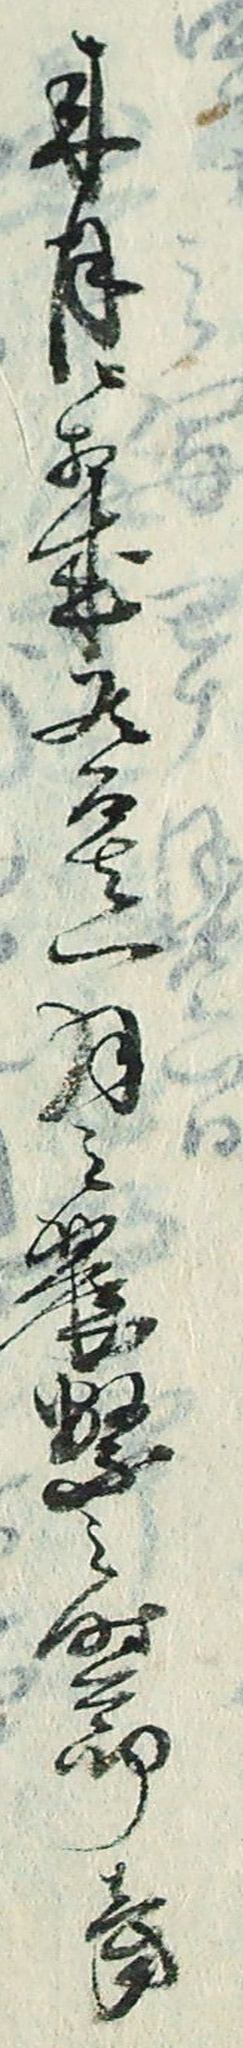来月ニ相成候而者一月之農繁之時節旁
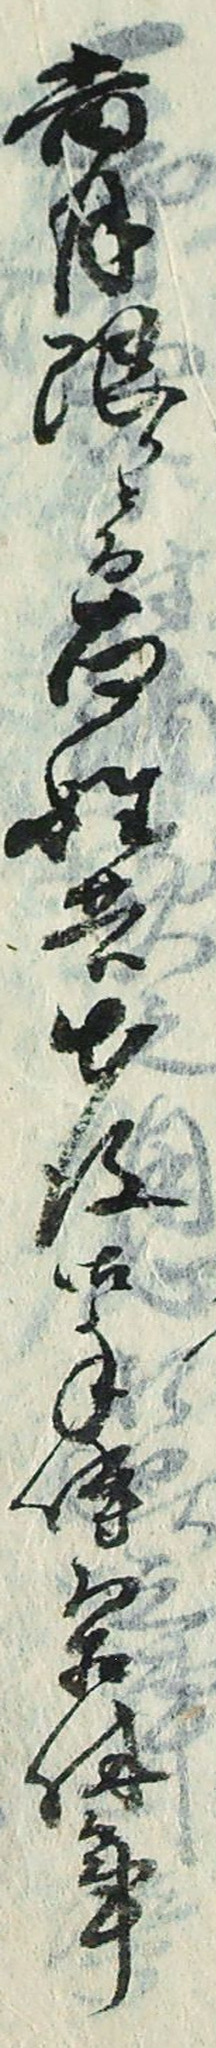當月限りニ而百姓共出役御手傳為相休候事
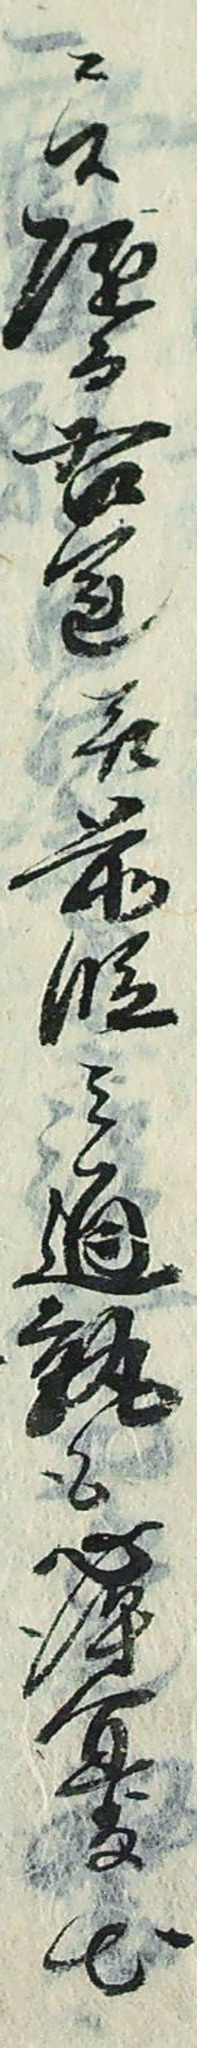ニ候随而右運幷前段之通孰も心得宜布出
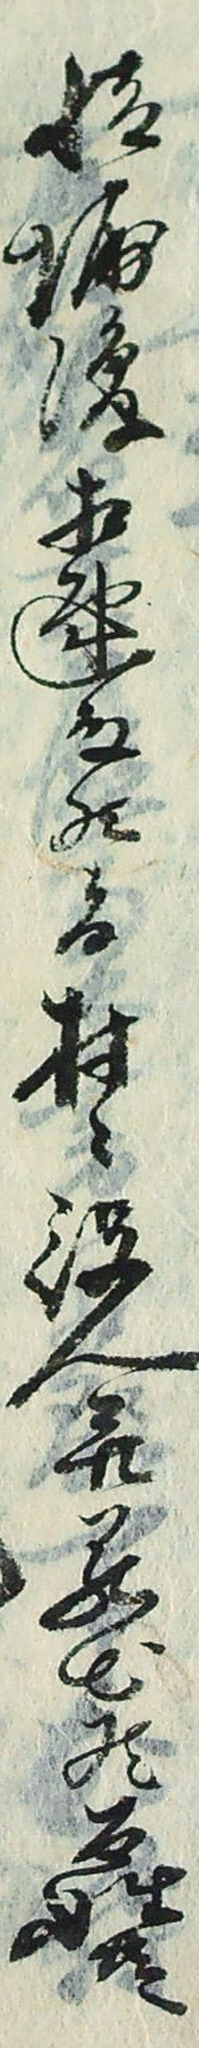精堀浚相速取候者村々役人共罷出候百姓共へ
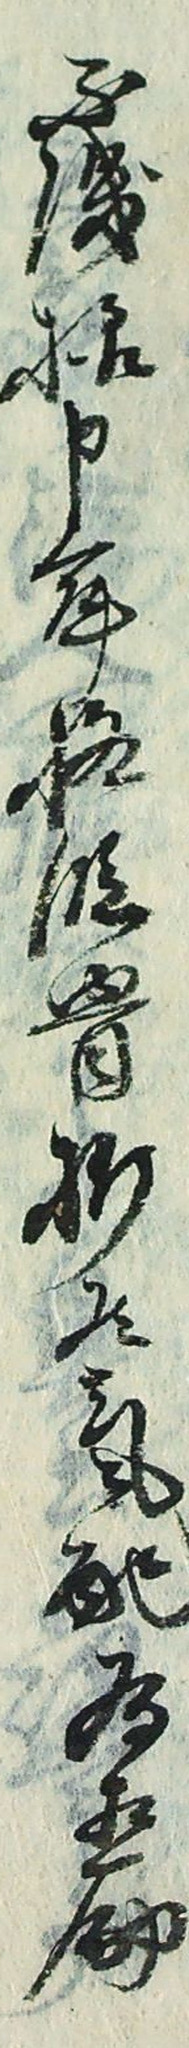不洩様申聞格段骨折候気配為相励
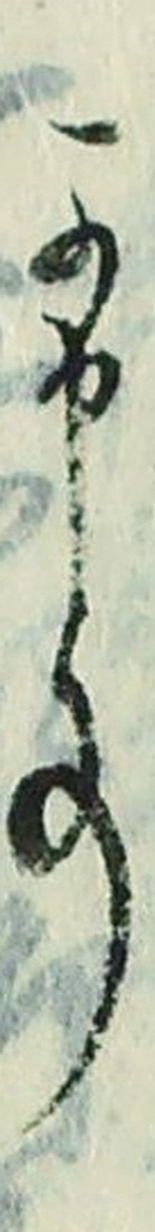可申事
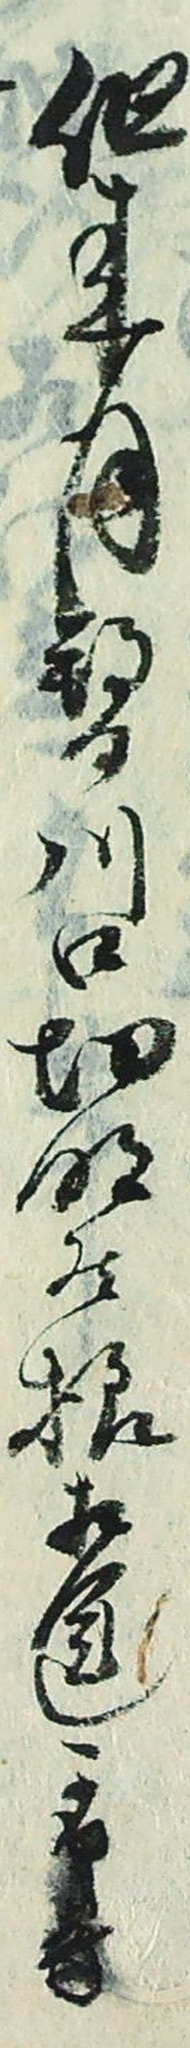但来月朔日川口切明候様相運可申付
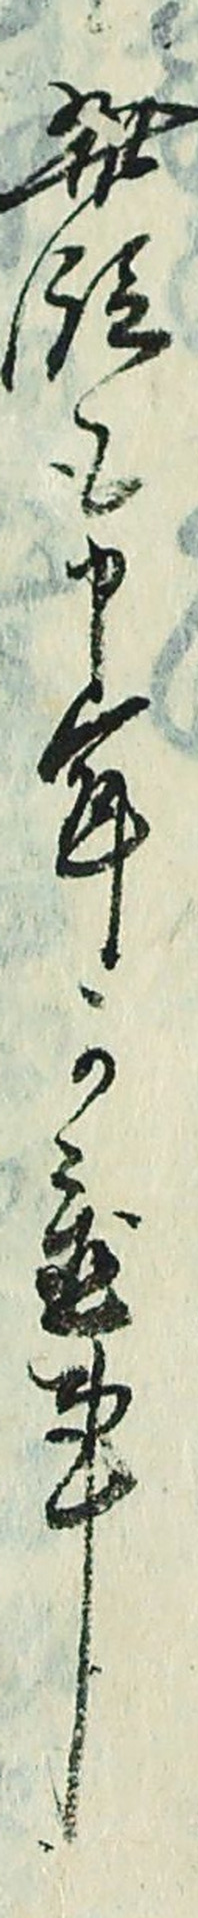此段も申聞可置事

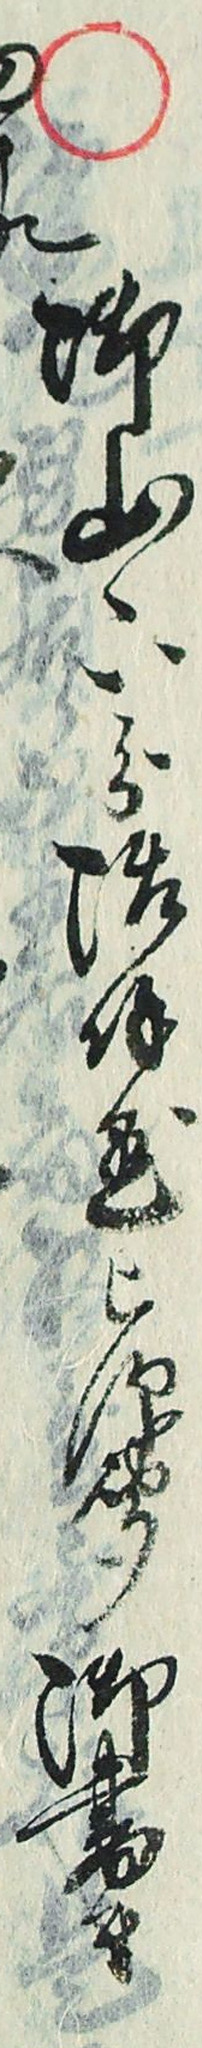○御山下分御呼懸被仰聞御書付
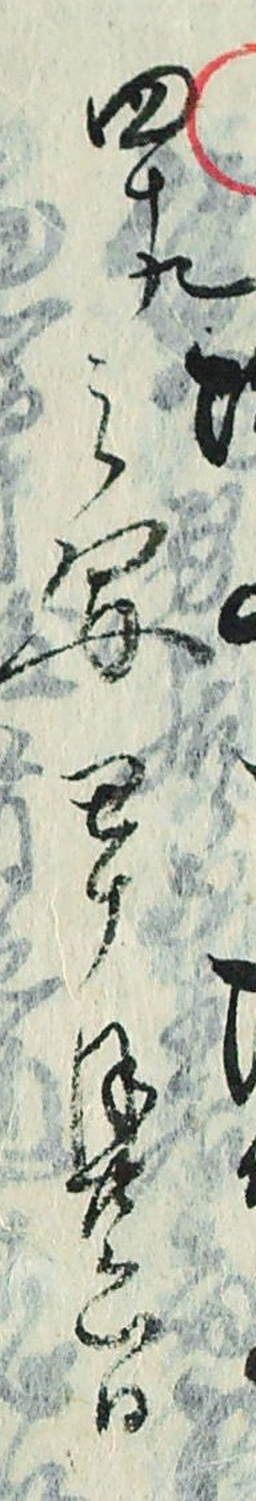四十九之写丑十月廿六日
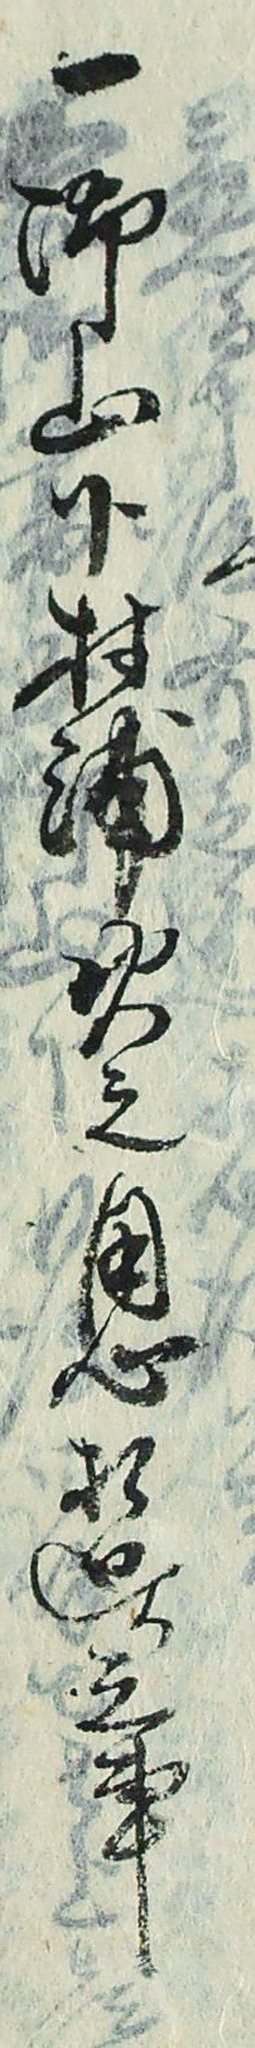一御山下村浦火之用心打廻り之事
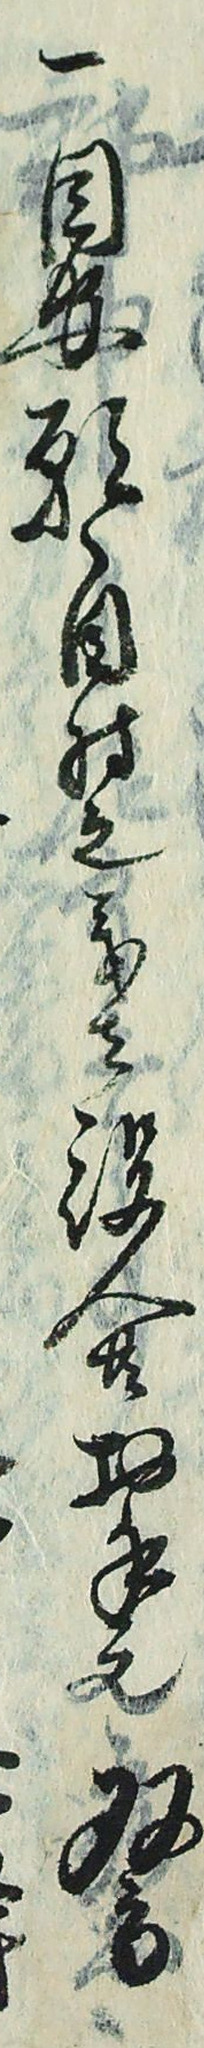一目安願自村之義者役人共於手元双方
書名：諸御趣意書并御下知向之写
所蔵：鳴門教育大学 Naruto University of Education
